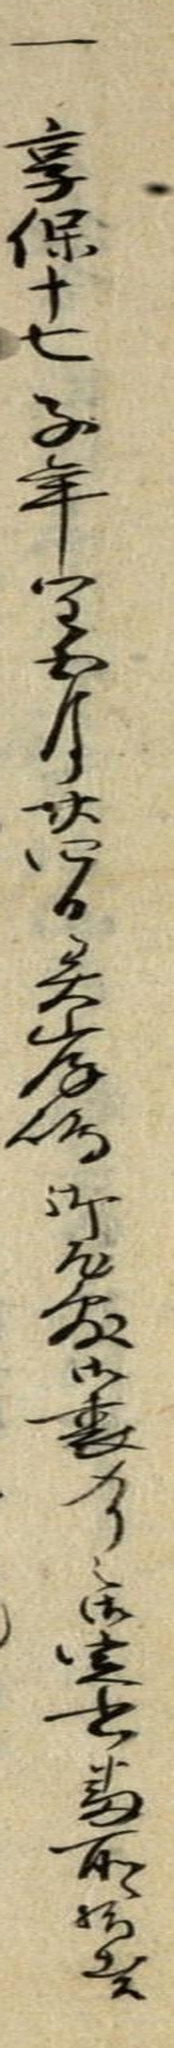一享保十七子年閏五月廿四日霊岸嶋御屋敷御裏〆り之御定書番所へ指出す
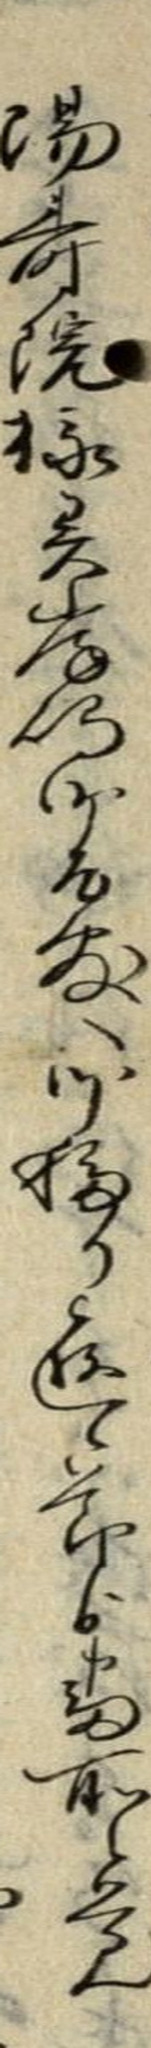一陽寿院様霊岸嶋御屋敷へ御移り被遊候節ゟ番所之覚
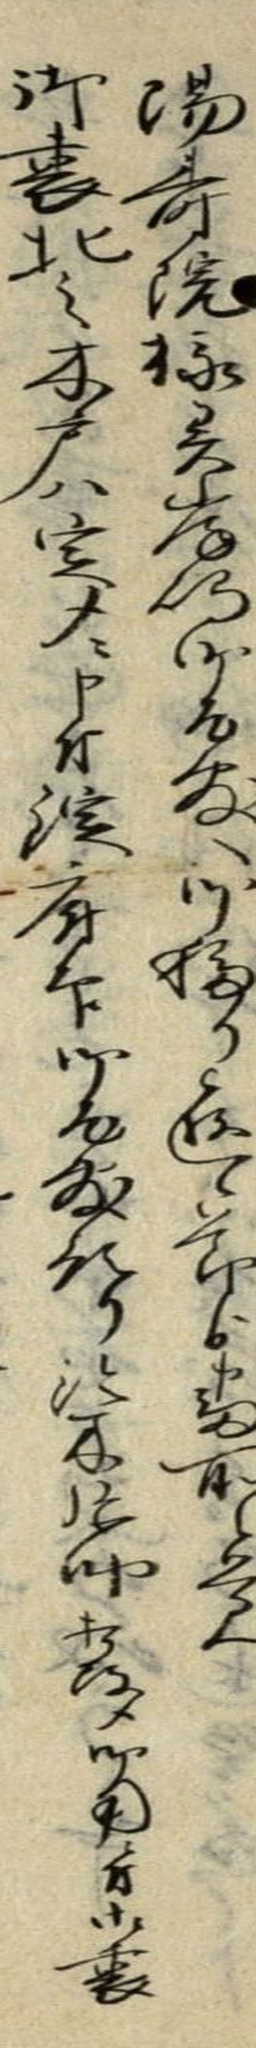一御裏北之木戸は定〆に申付錠府印御屋敷預鈴木弥助相改め御用に付御裏
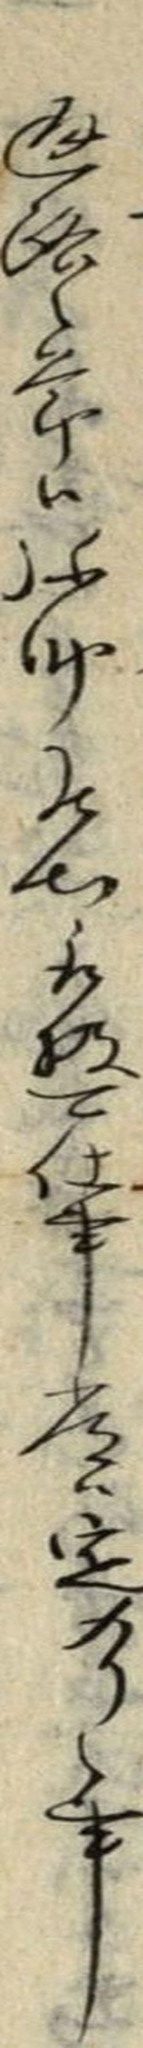通路之節は弥助罷出取扱可仕事常は定〆り之事
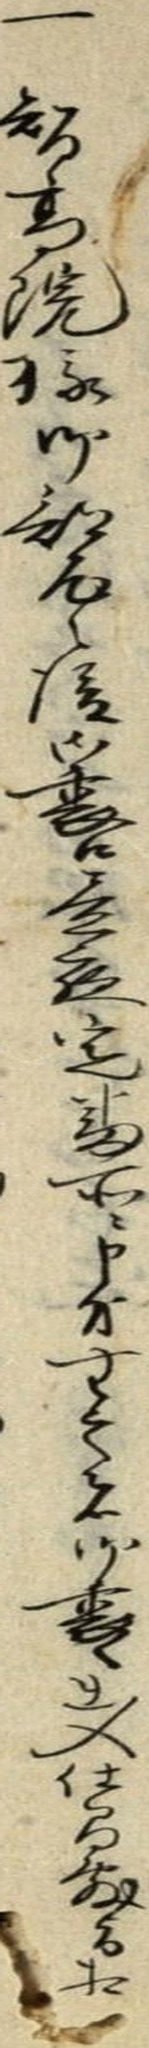一智高院様御部屋之後御裏口昼夜定番所に申付無之は御裏へ出入仕間敷旨相
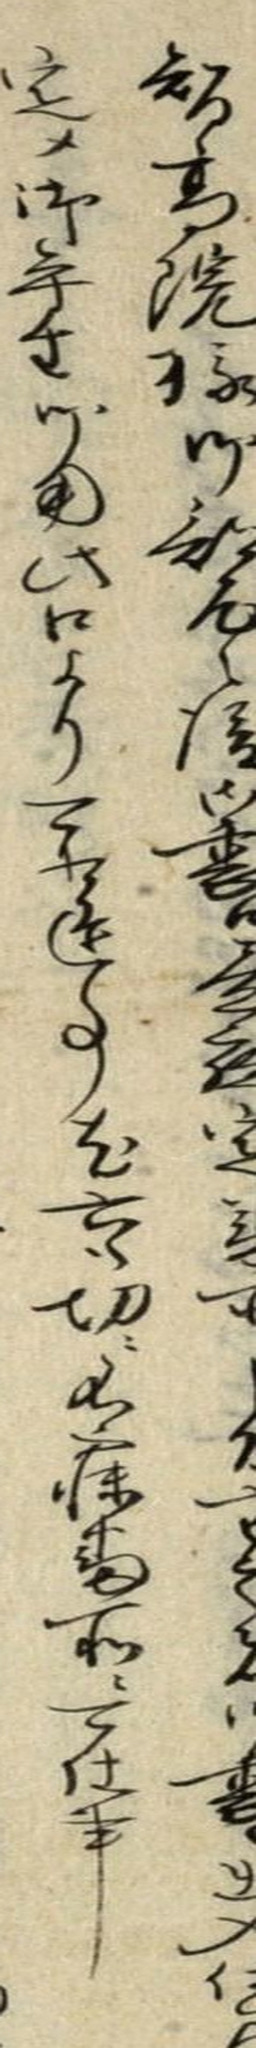定め御平生御用此口より可相達事尤六ツ切に不寝番所に可仕事
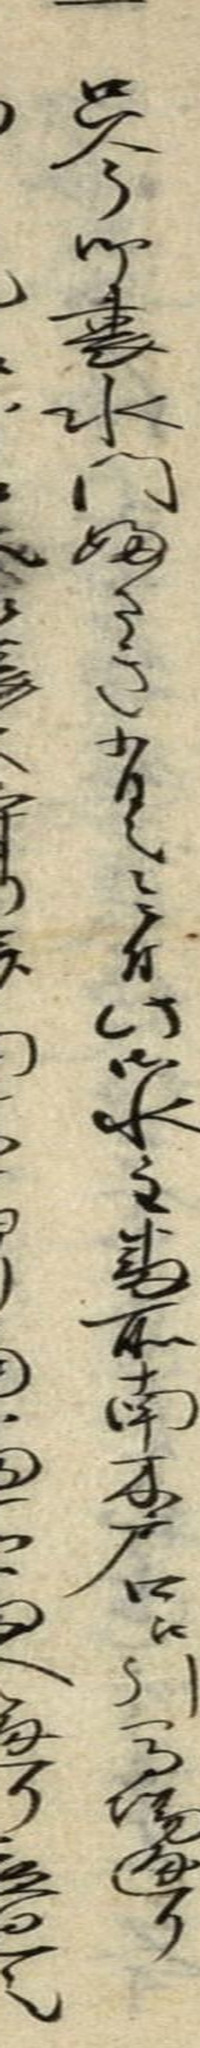一只今御裏水門ふさき有之候に付此御水主番所南木戸口江引馬場通り
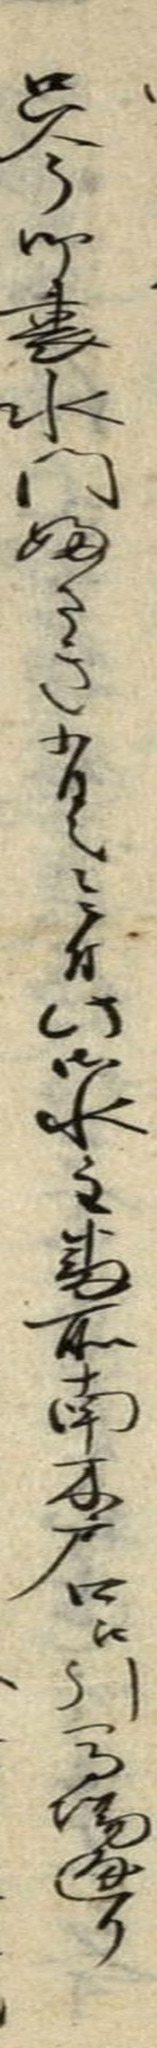一只今御裏水門ふさき有之候に付此御水主番所南木戸口江引馬場通り
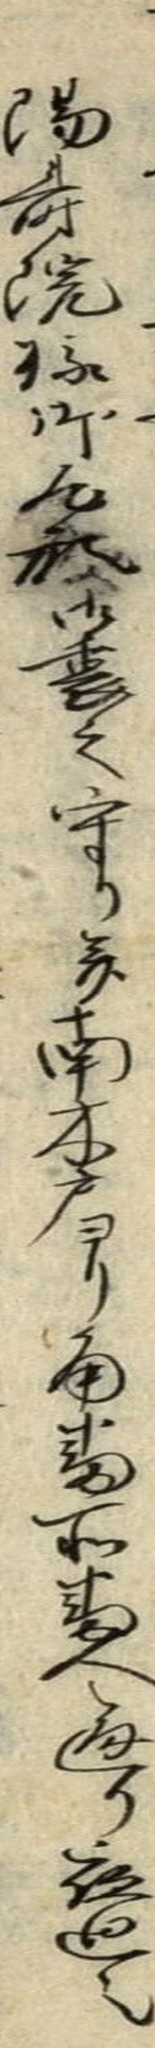陽寿院様御屋形御裏之守り幷南木戸より角番所番人之通り夜廻之
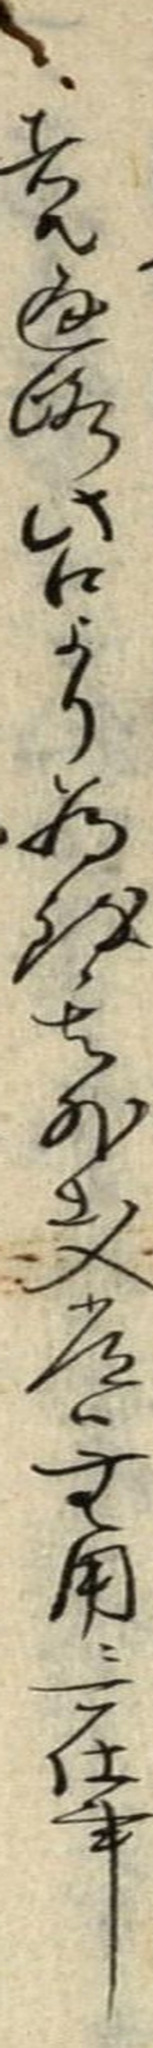者共通路此口より為致其外出入常は無用に可仕事
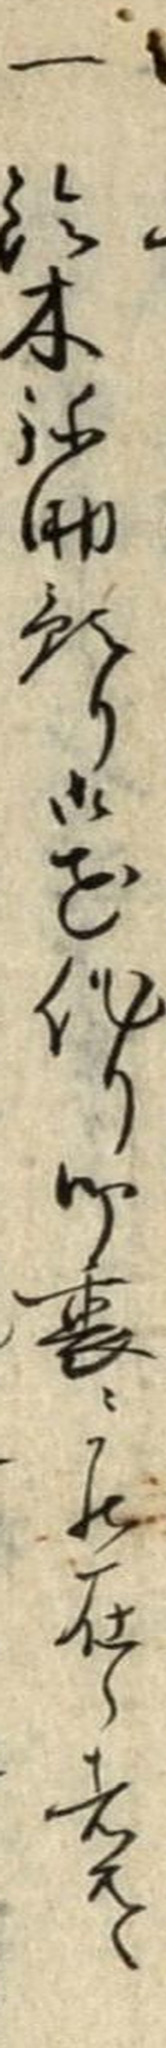一鈴木弥助預り御花作り御裏に罷在候者共へ
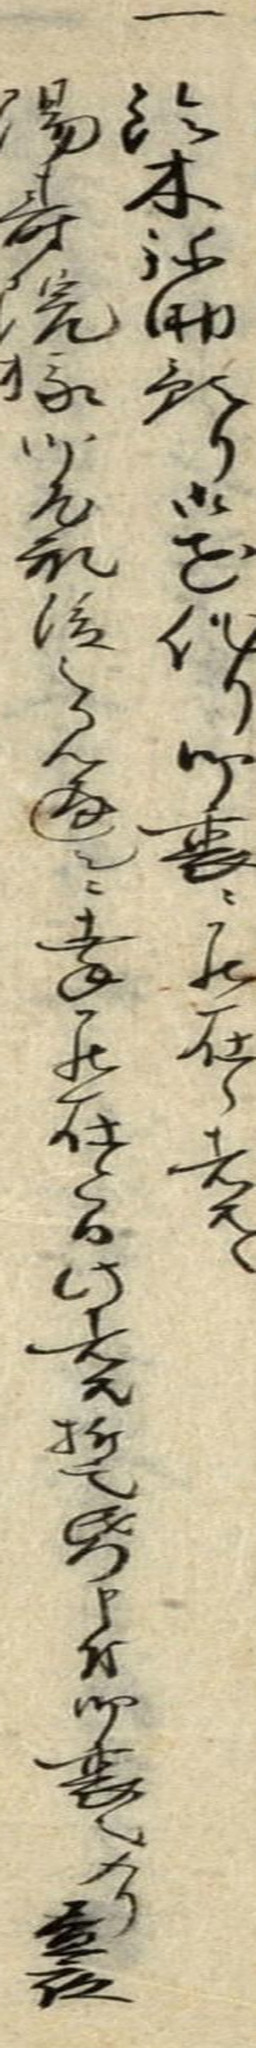陽寿院様御屋形後之見通しに幸罷在候間此者共誓紙申付御裏之〆り昼夜
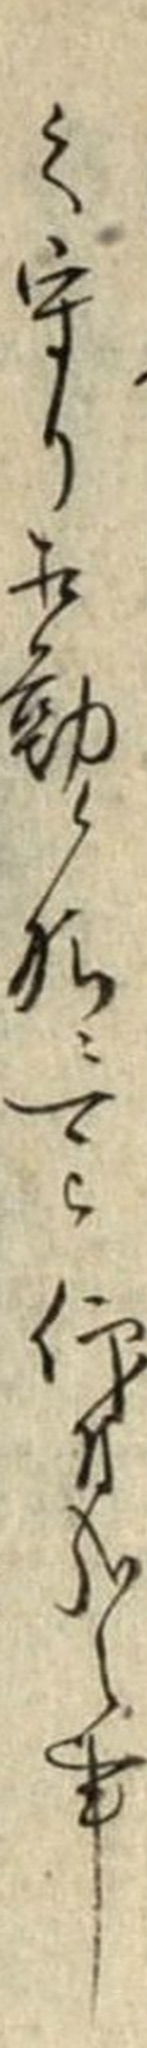之守り相勤候様に可被仰付哉之事
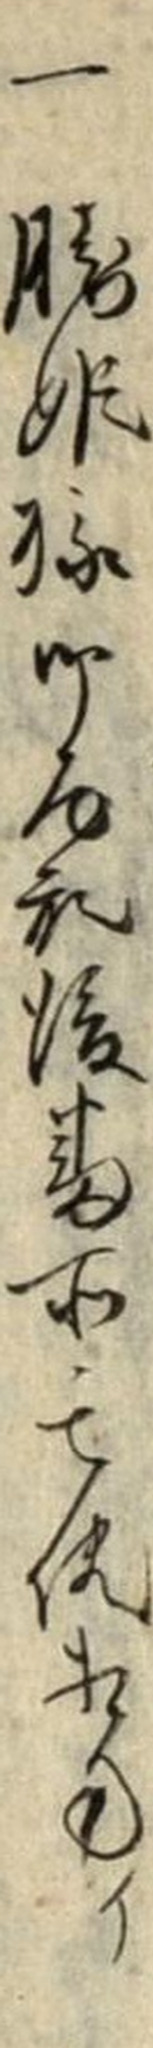一勝姫様御屋形後番所其儘相用い
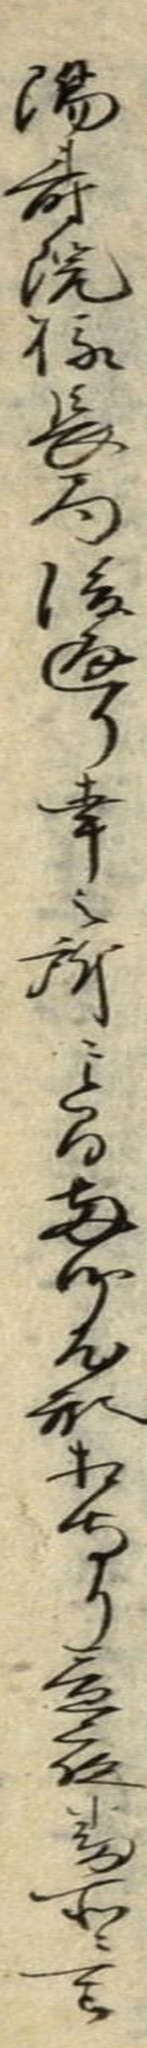陽寿院様長局後通り幸之所に候間両御屋形相守り昼夜番所に可被

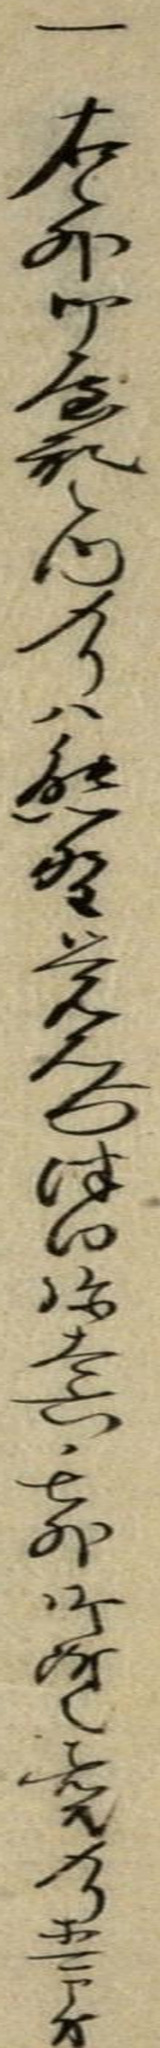一右之外御屋形之内〆りは熊野覚右衛門津田弥太六其外御附之者共〆り等可申付
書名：三都并道中之部
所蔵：福井県文書館 Fukui Prefectural Archives
